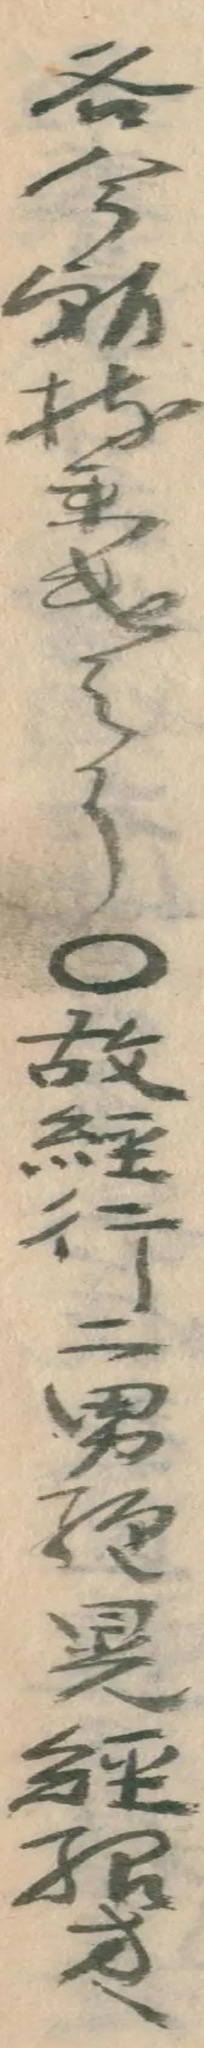各今朝持参遣之分○故経行二男経晃経招方へ

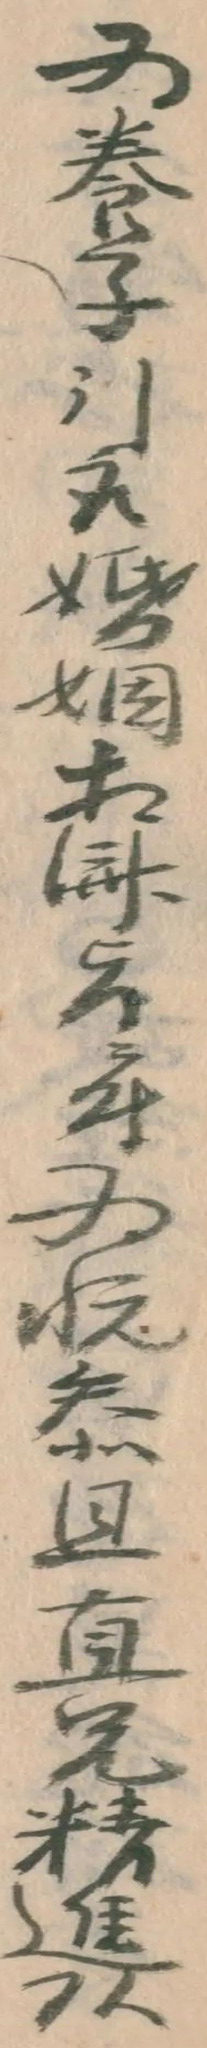為養子引取婚姻相済旨ニ付為祝参且直兄精進頭
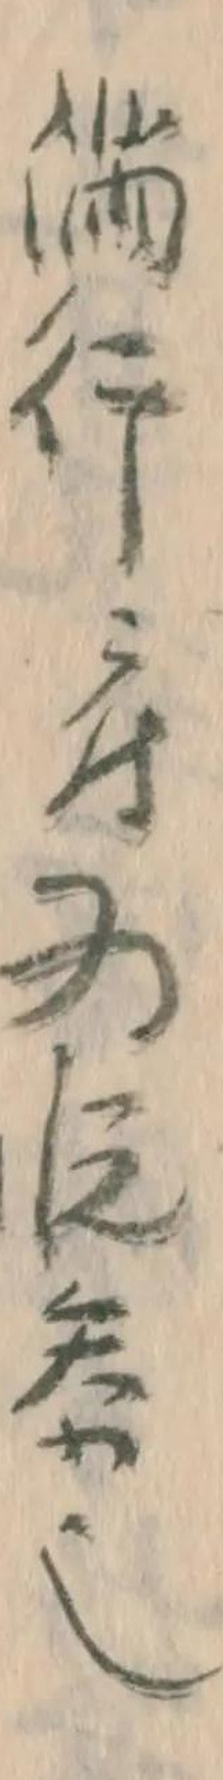満行ニ付為仕祝参也
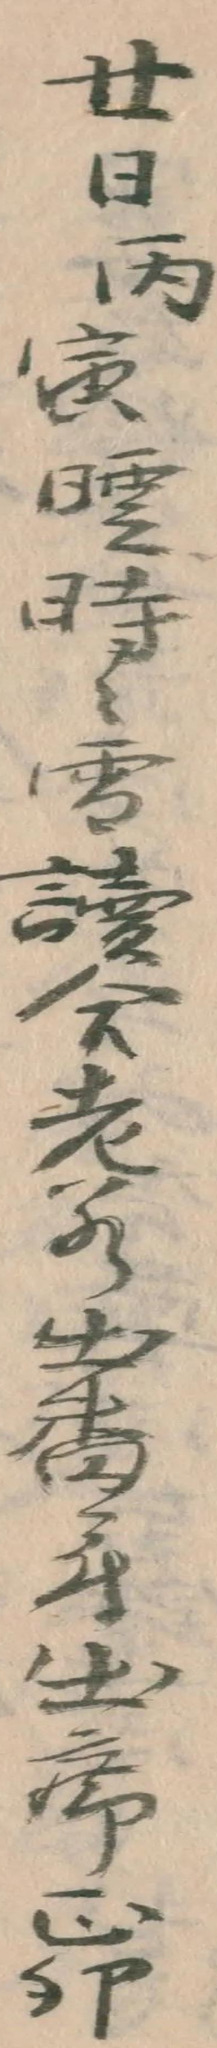廿日丙寅時々雪讀合老若出番ニ付出席正卯
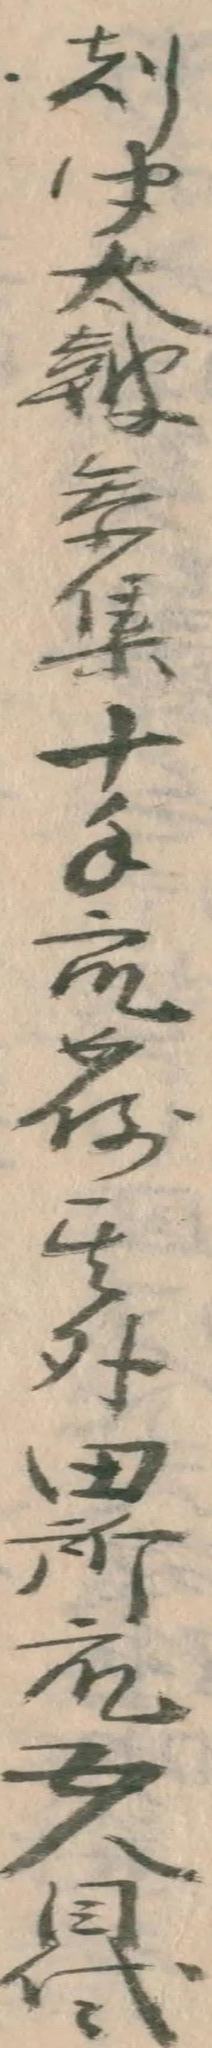刻聞太鼓参集十手衆如何其外田所衆五人目代々
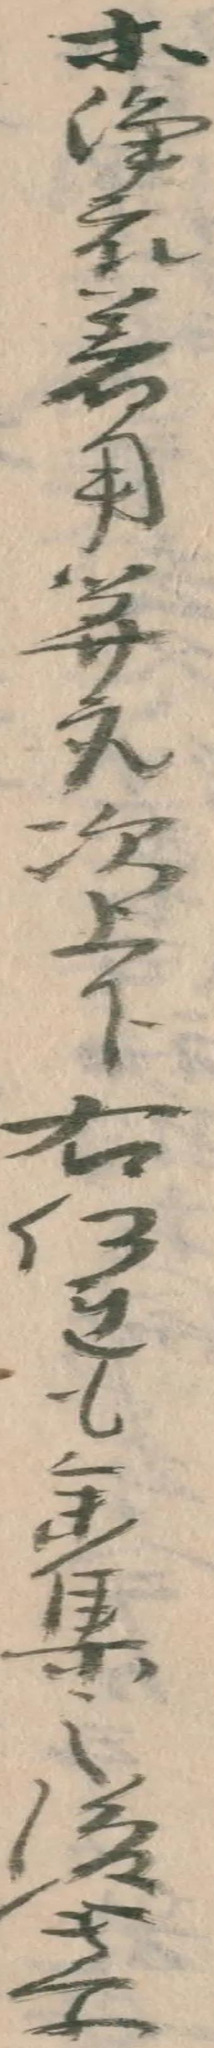等浄衣着用算取次上下右仕れも参集之後其會所
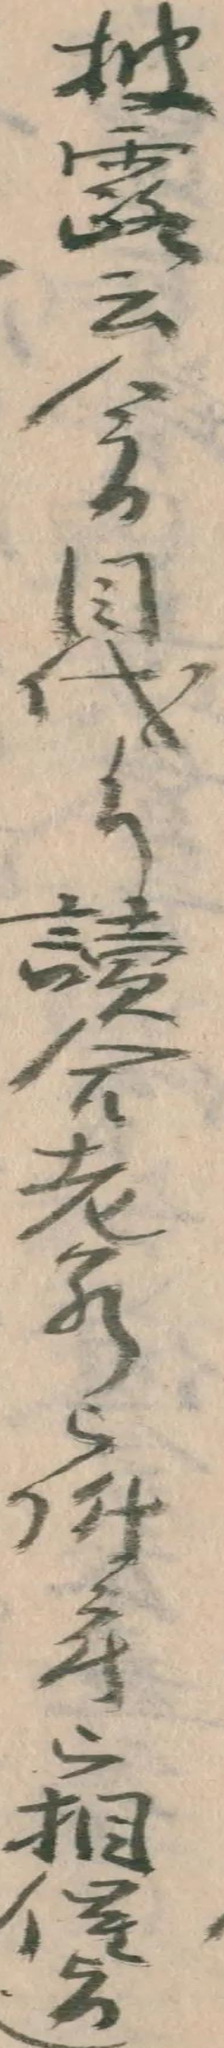披露云今日目代より讀合老若被附ニ付被相催候
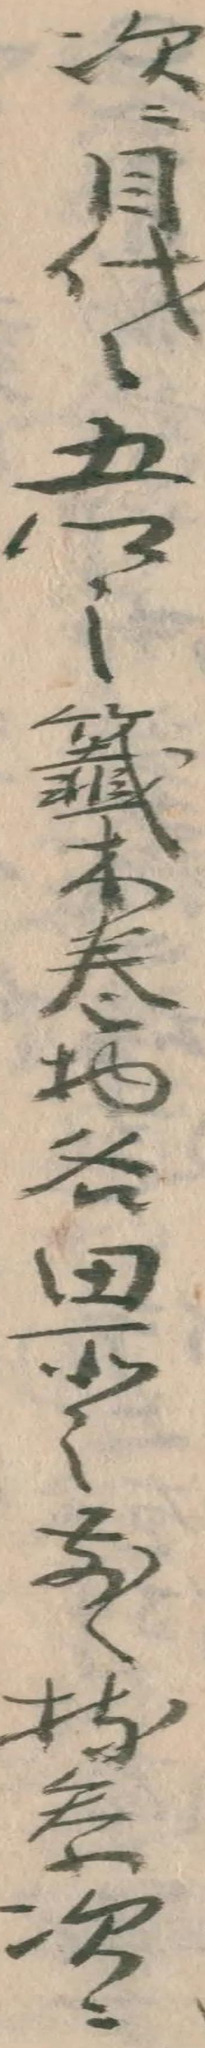次ニ目代々五郷之籤木巻物各田所之前へ持参次ニ
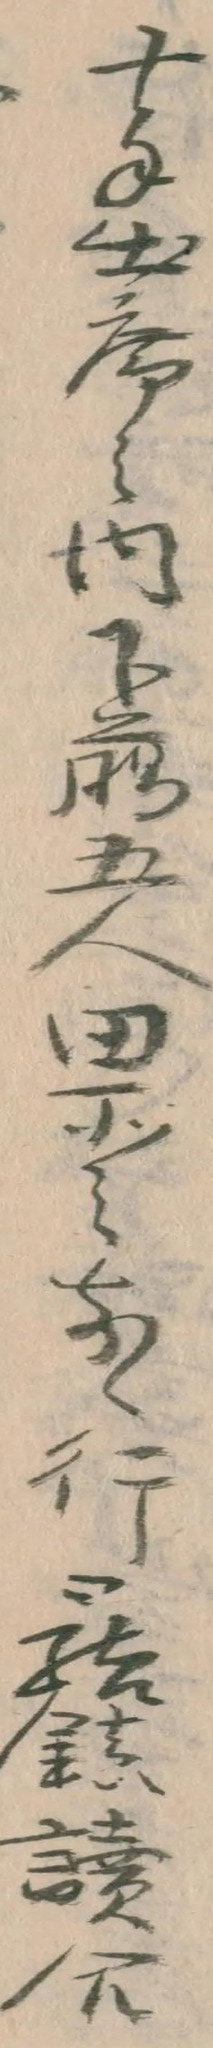十手出席之内下臈五人田所之前へ行御結鎮讀合
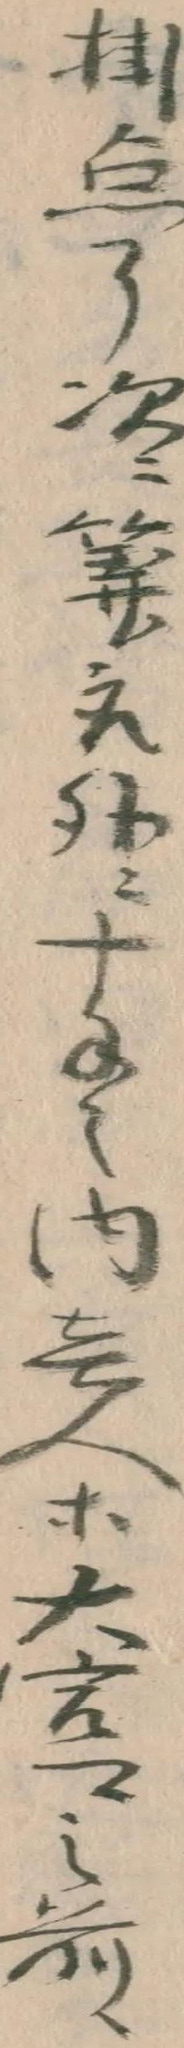掛点了次に算取外に十手之内壱人等大宮郷之前へ
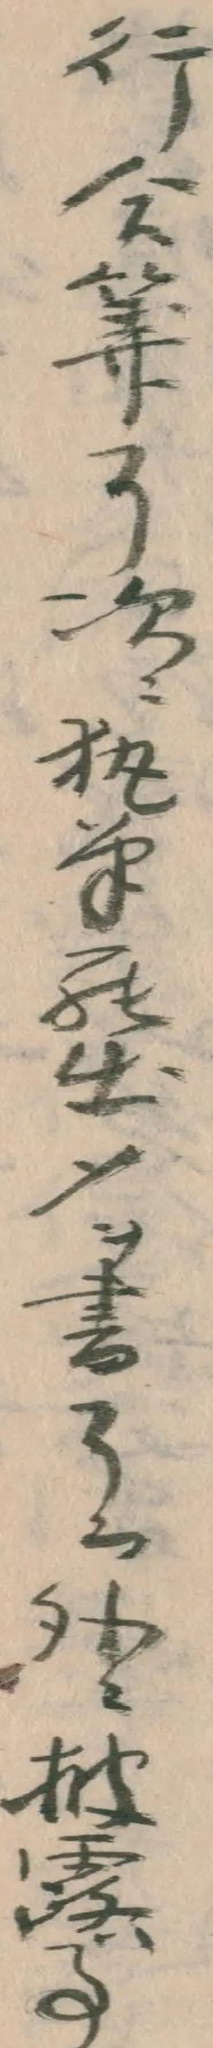行合算了次に執筆罷出〆ヲ書了而外ニ披露事
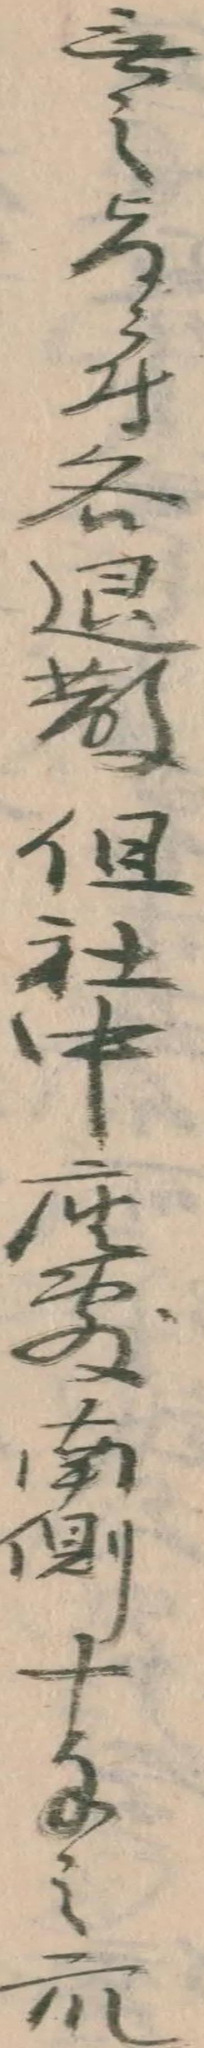無之旨ニ付各退散但社中座敷南側十手之衆
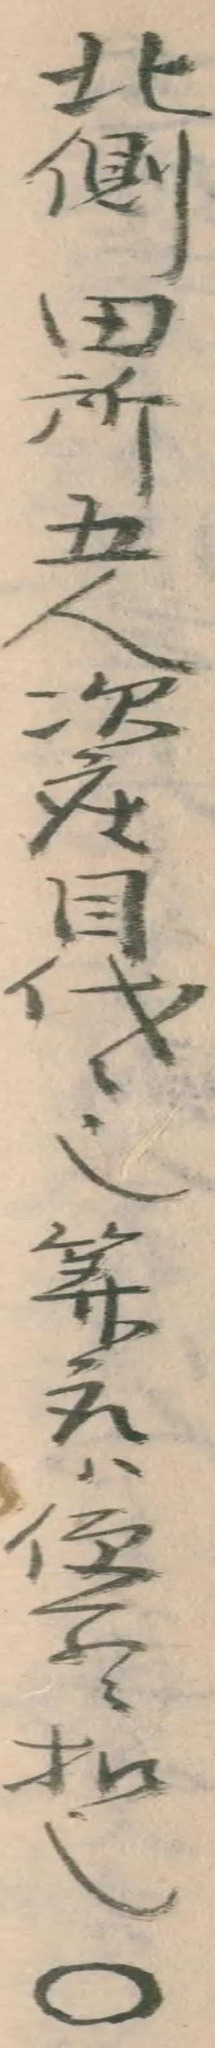北側田所五人次座目代々也算取ハ便品に扣也○
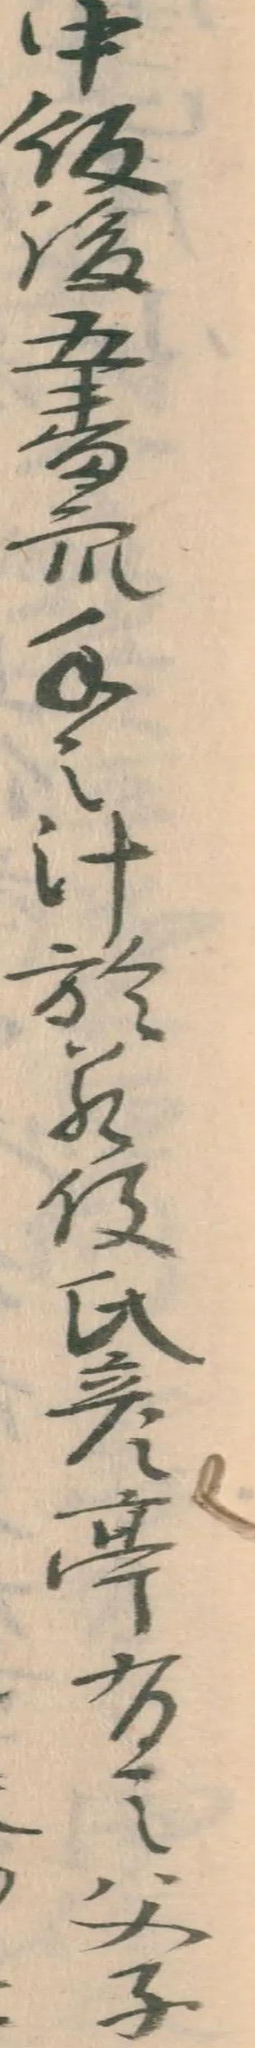中飯後五番衆手之汁於若役民彦亭有之父子
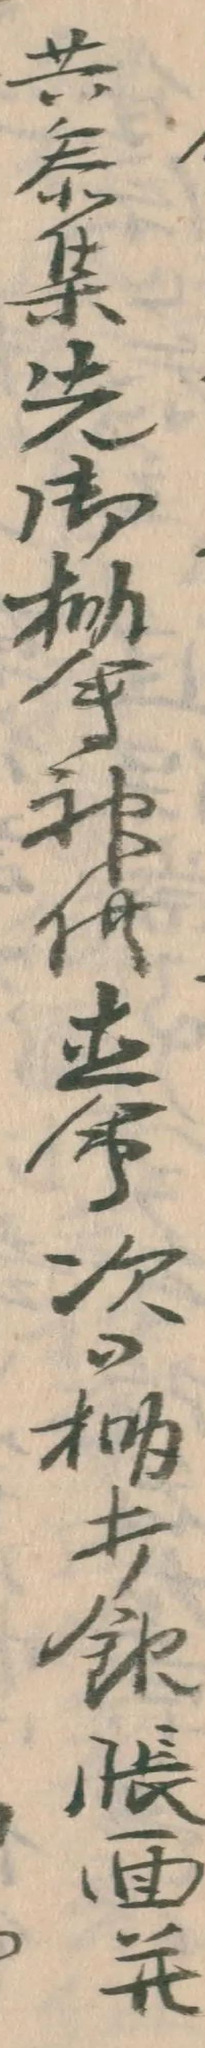共参集先御棚會神供直會次御棚打帳銀帳面并
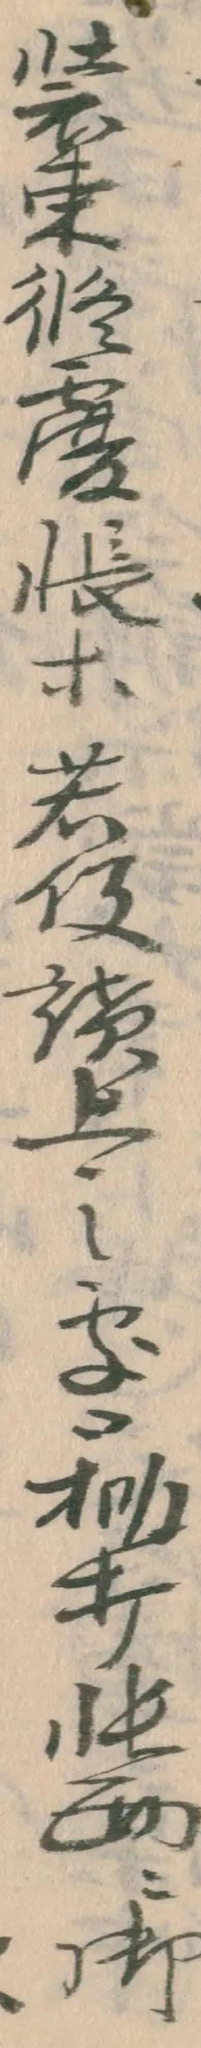装束修覆帳等若役讀上之處御棚打帳面ニ御
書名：賀茂社記録. 第63冊
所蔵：国立国会図書館 National Diet Library, JAPAN
